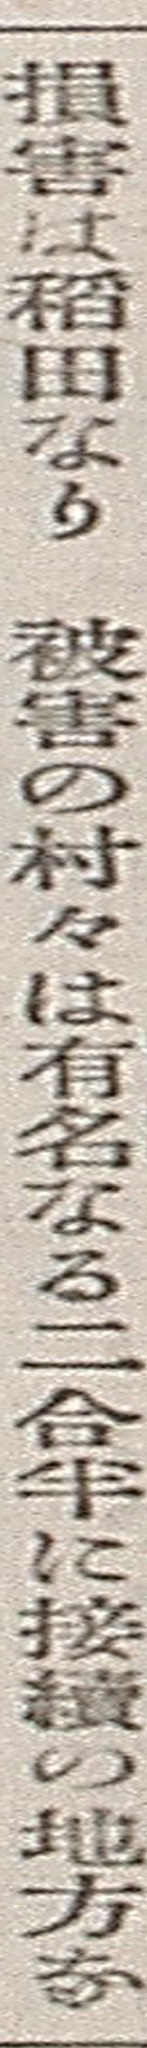損害は稲田なり被害の村々は有名なる二合半の接続の地方な
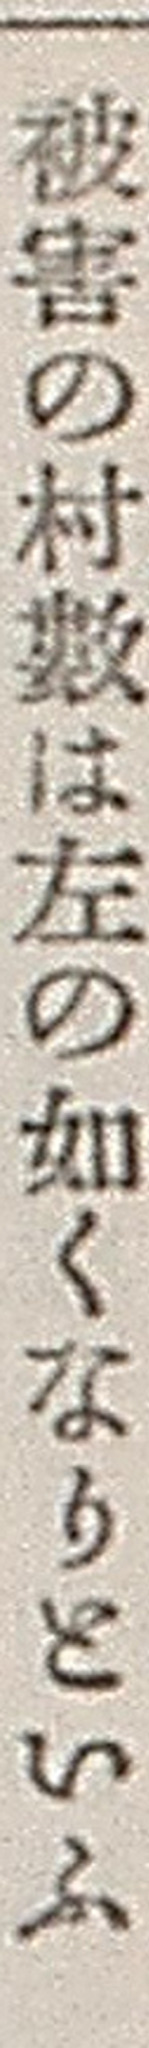被害の村数は左の如くなりといふ
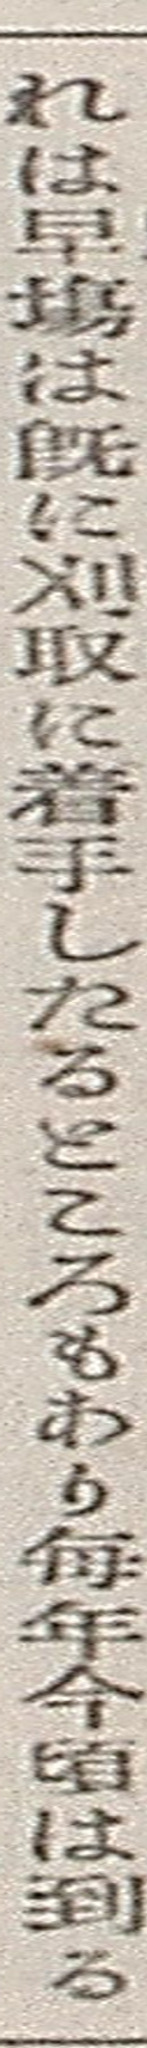れは早場は既に刈取に着手したるところもあり毎年今頃は到る
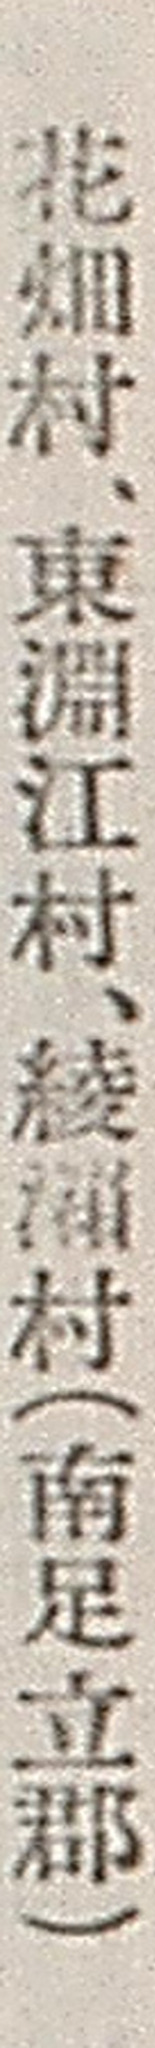花畑村、東淵江村、綾瀬村
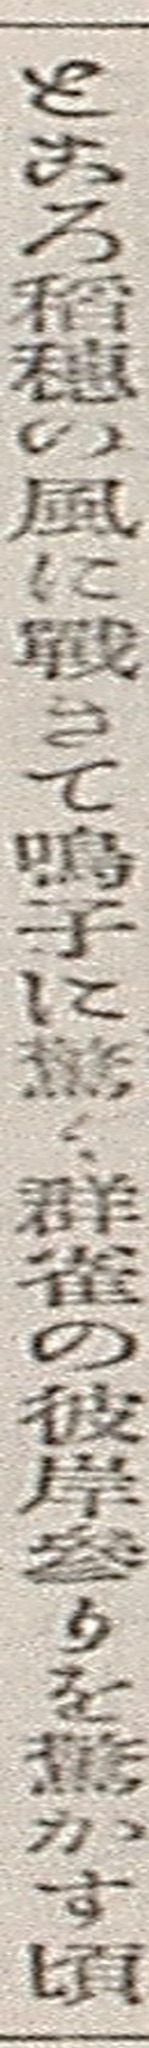ところ稲穂の風に戦きて鳴子に驚く郡雀の彼岸参りを驚かす頃
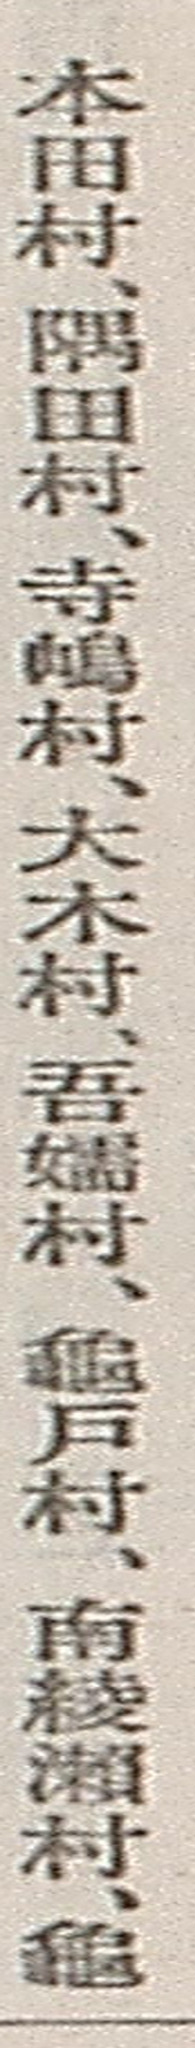本田村、隅田村、寺嶋村、大木村、吾嬬村、亀戸村、南綾瀬村、亀
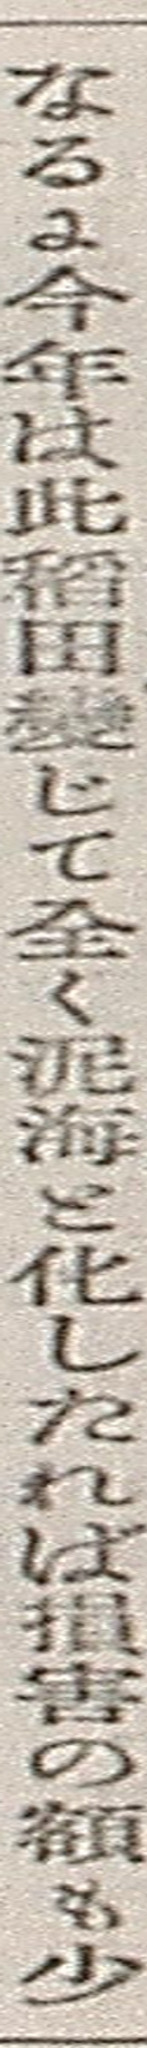なるに今年は此稲田変じて全く泥海と化したれば損害の額も少
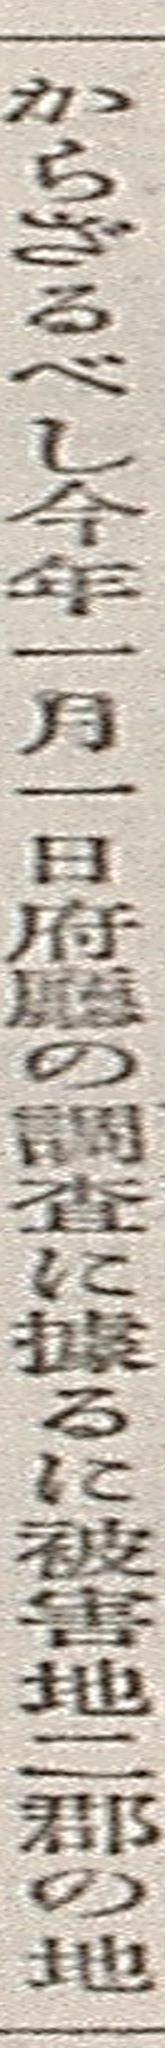からざるべし今年一月一日府庁の調査に拠るに被害地二郡の地
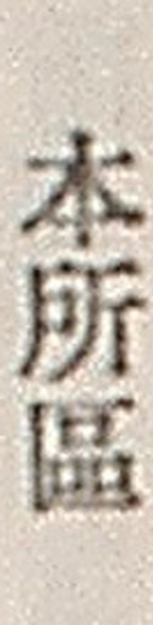本所区
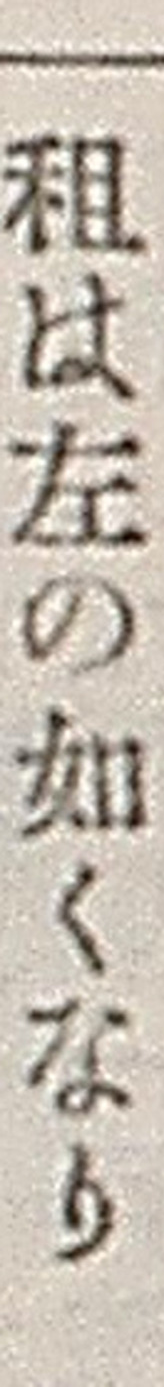租は左の如くなり
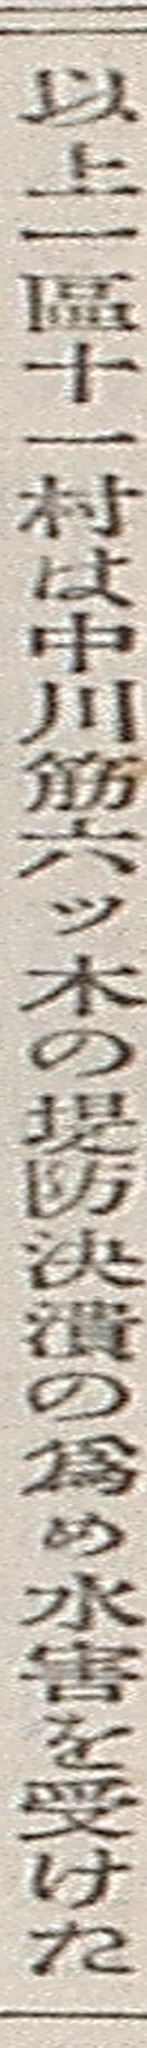異状一区十一村は中川筋六ツ木の堤防決潰の為め水害を受けた
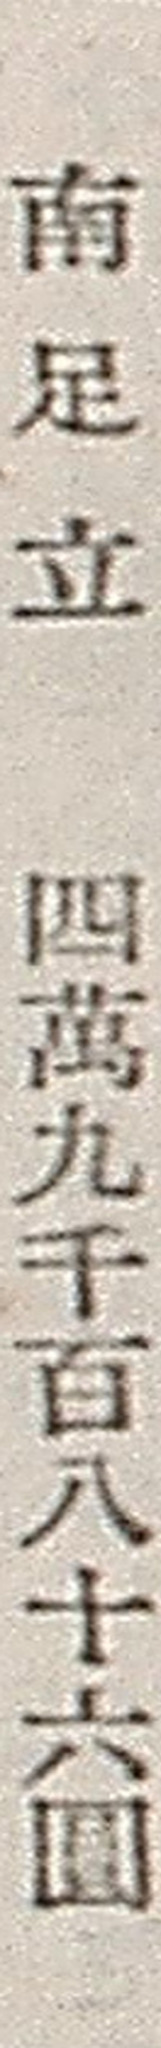南足立四万九千百八十六円
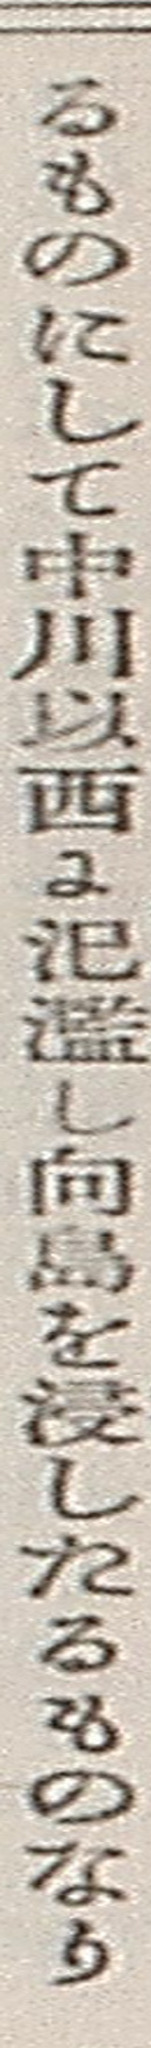るものにして中川以西に氾濫し向島を浸したるものなり
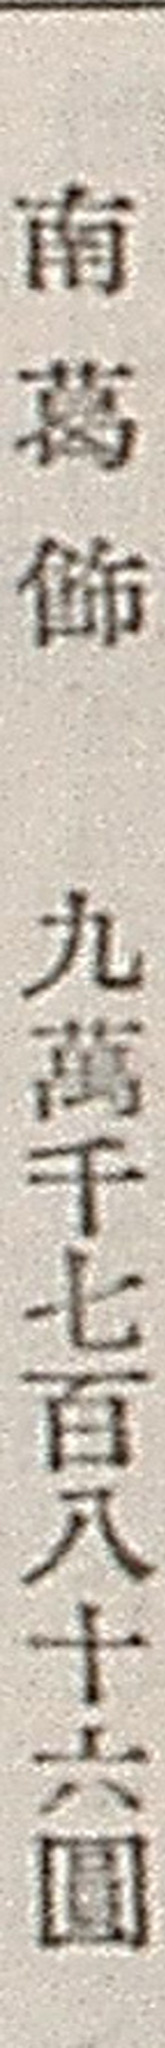南葛飾九万千七百八十六円
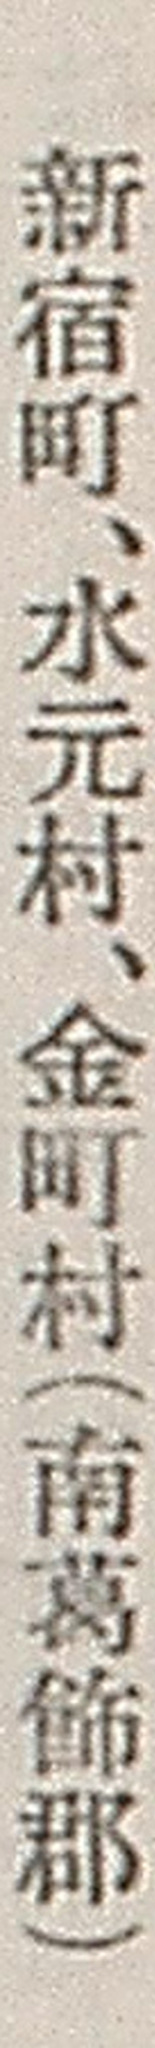新宿町、水元村、金町村
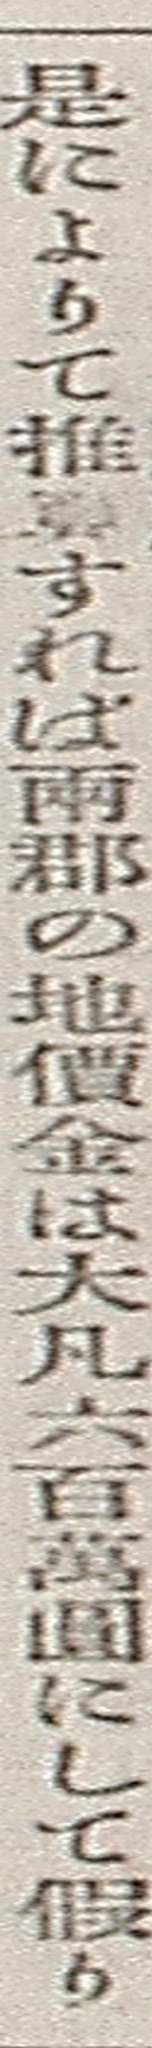是によりて推算すれば両郡の地価金は大凡六百万円にして仮り
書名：風俗畫報臨時増刊第百二十四號　洪水地震被害録（上）
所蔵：東京大学地震研究所図書室 Earthquake Research Institute Library, The University of Tokyo, JAPAN
